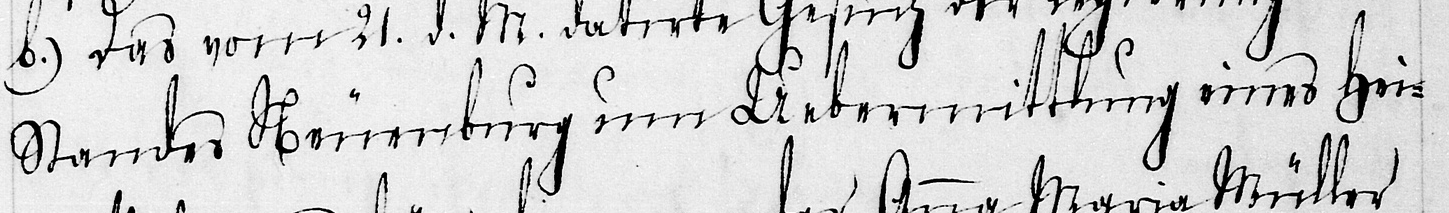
Standes Neuenburg um Uebermittlung eines Hei¬
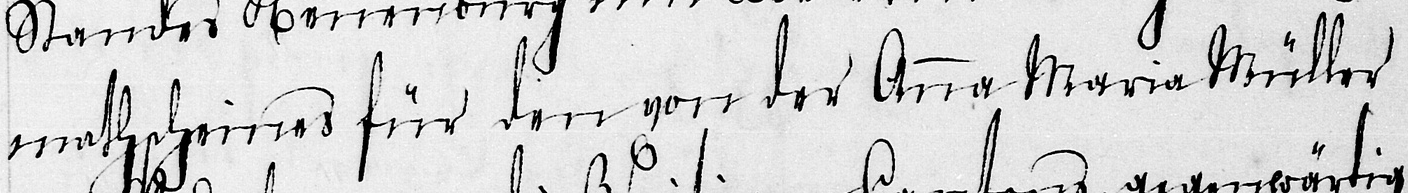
mathscheines für den von der Anna Maria Müller
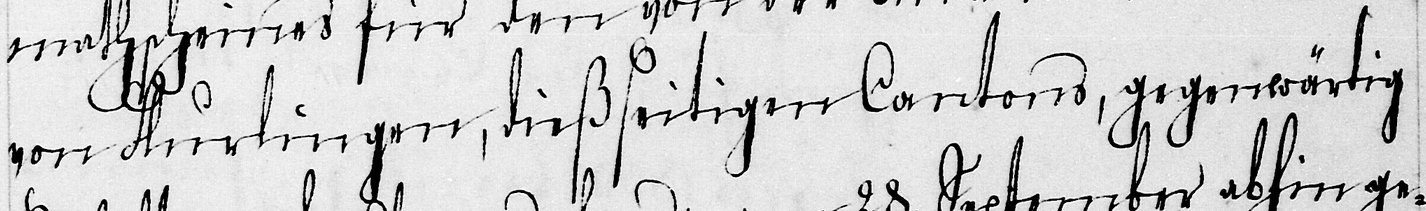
von Flurlingen, dießseitigen Cantons, gegenwärtig
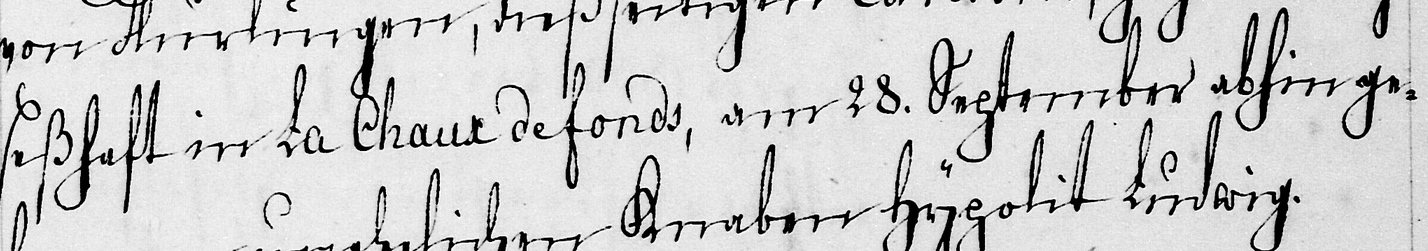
seßhaft in La Chaux de fonds, am 28. September abhin ge¬
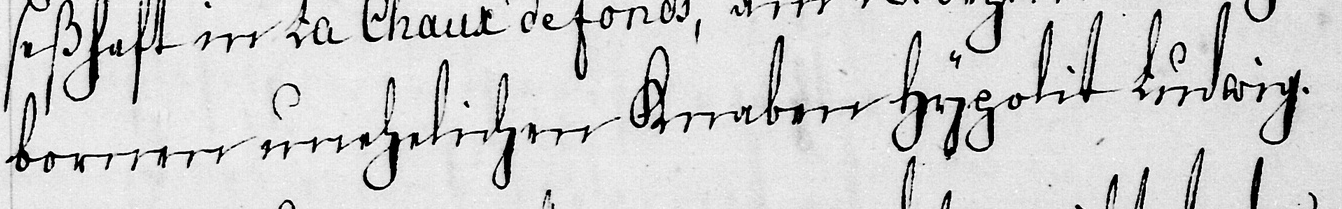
bornen unehelichen Knaben Hypolit Ludwig.
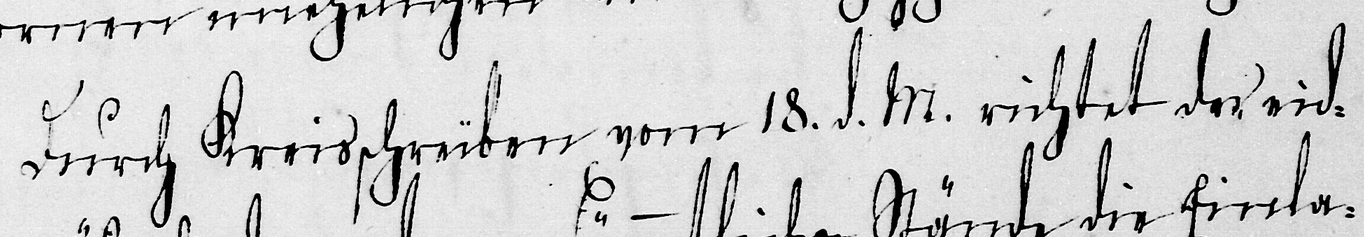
Durch Kreisschreiben vom 18. d. M. richtete der eid¬
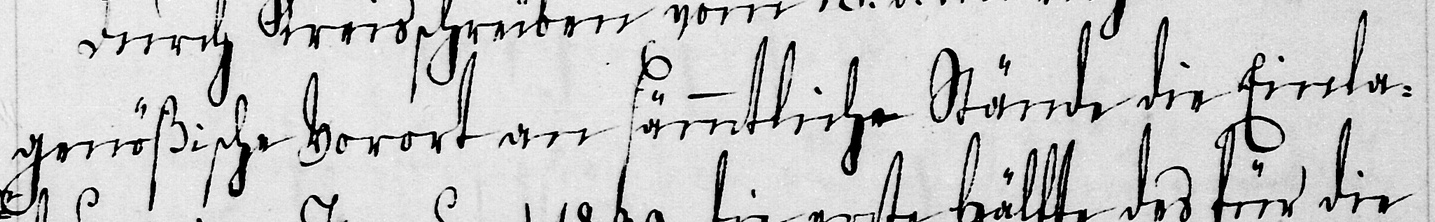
genößische Vorort an sämmtliche Stände die Einla¬
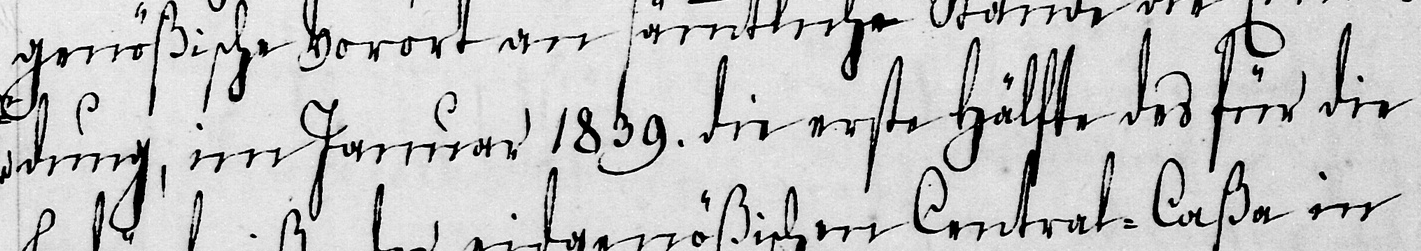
dung, im Januar 1839. die erste Hälfte des für die
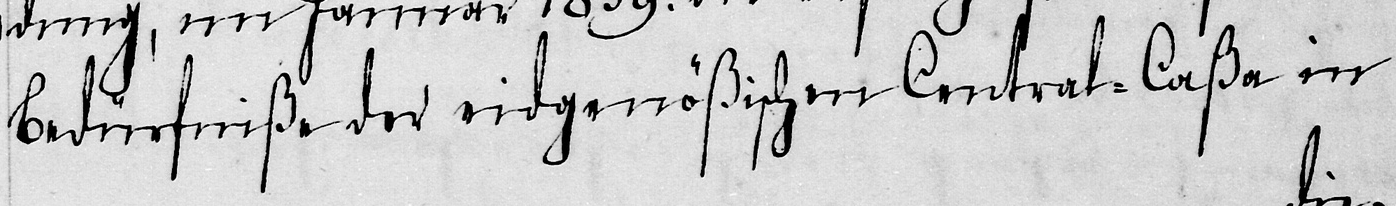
Bedürfniße der eidgenößischen Central-Caßa in
